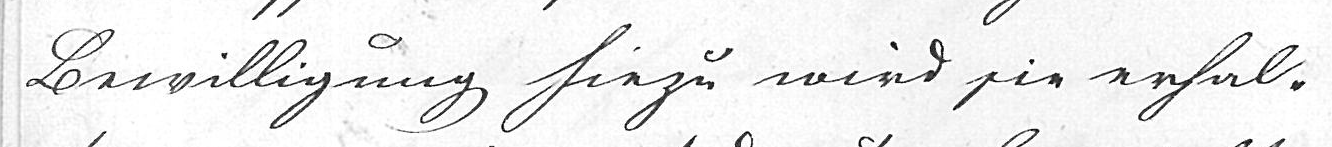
Bewilligung hiezu wird sie erhal-
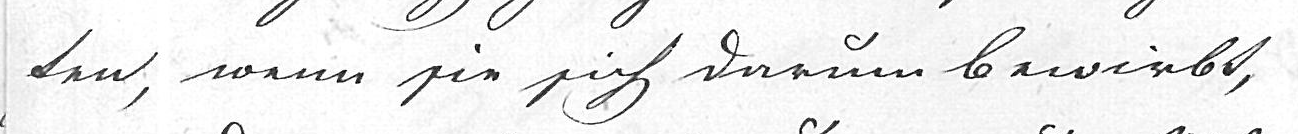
ten, wenn sie sich darum bewirbt,
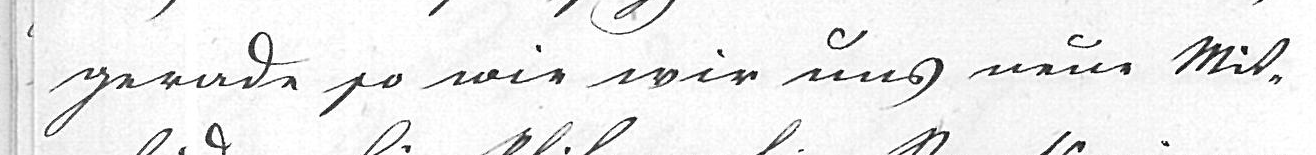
gerade so wie wir uns neue Mit-
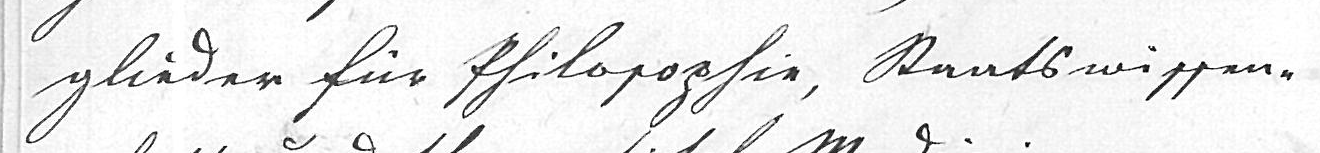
glieder für Philosophie, Staatswissen-
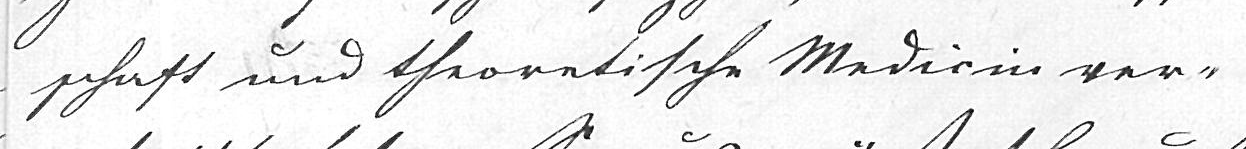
schaft und theoretische Medicin ver-
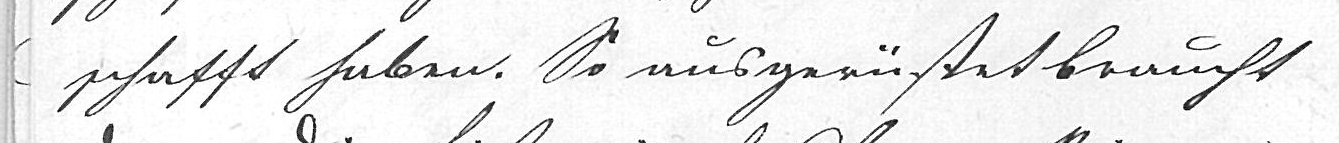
schafft haben. So ausgerüstet braucht
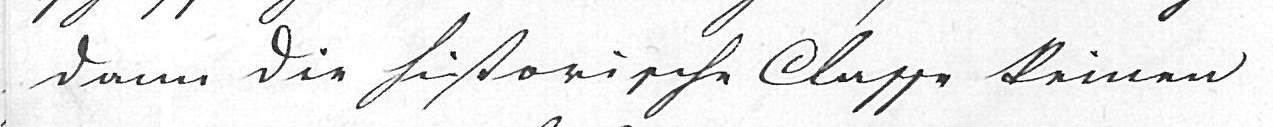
dann die historische Classe keinen
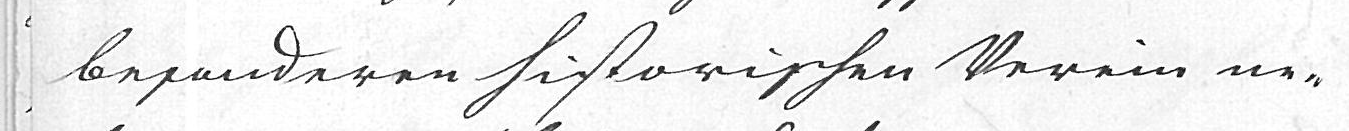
besonderen historischen Vereine ne-
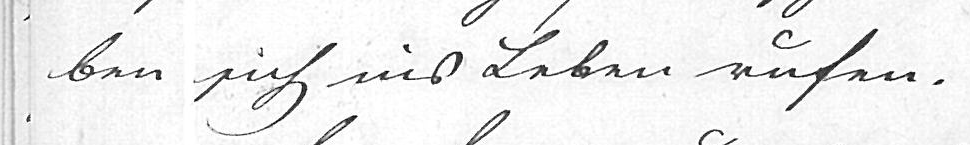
ben sich ins Leben rufen.
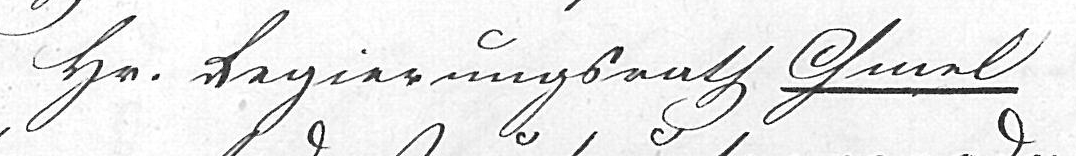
Hr. Regierungsrath Chmel
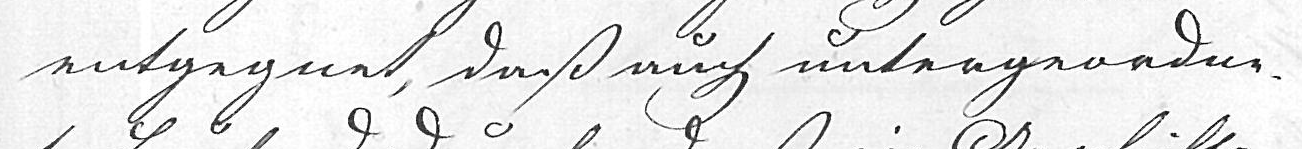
entgegnet, daß auf untergeordne-
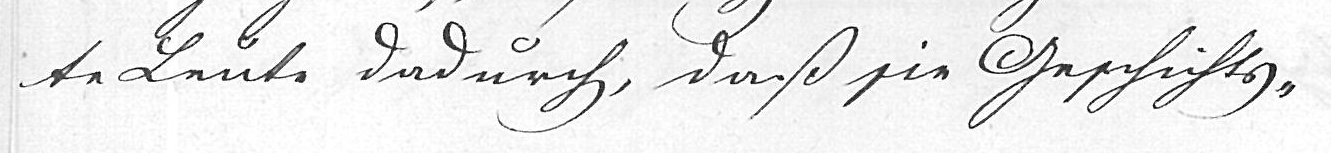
te Leute dadurch, daß sie Geschichts-
